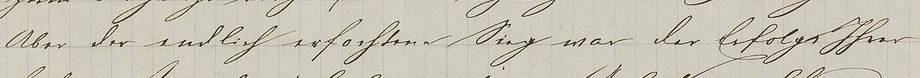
Aber der endlich erfochtene Sieg war der Erfolg Ihrer
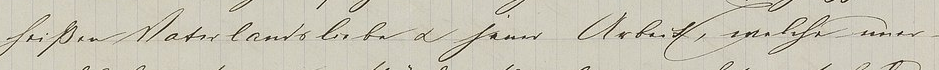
heißen Vaterlandsliebe & jener Arbeit, welche uner-
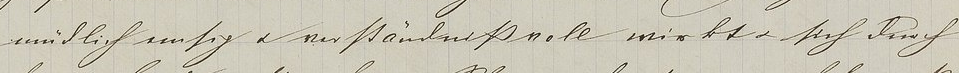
müdlich emsig & verständnißvoll wirkt & sich durch
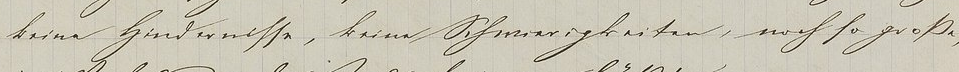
keine Hindernisse, keine Schwierigkeiten, noch so große,
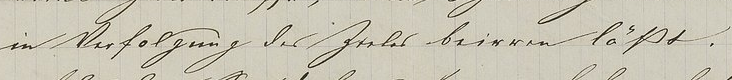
in Verfolgung des Zieles beirren läßt.
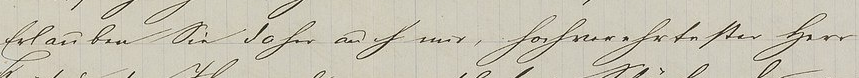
Erlauben Sie daher auch mir, hochverehrtester Herr
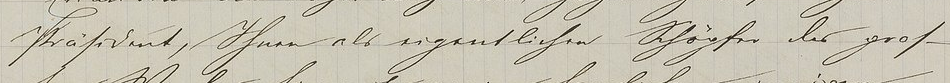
Präsident, Ihnen als eigentlichen Schöpfer des gros-
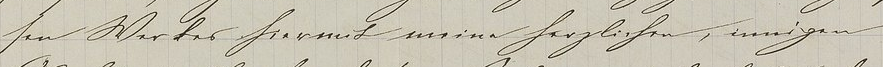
sen Werkes hiermit meine herzlichen, innigen
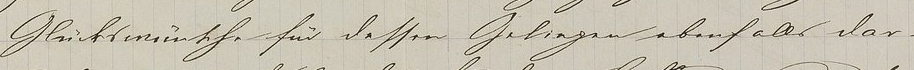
Glückswünsche für dessen Gelingen ebenfalls dar-
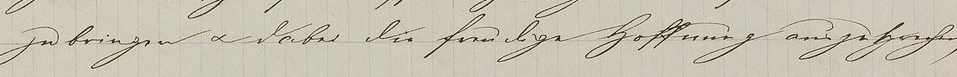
zubringen & dabei die freudige Hoffnung auszusprechen,
